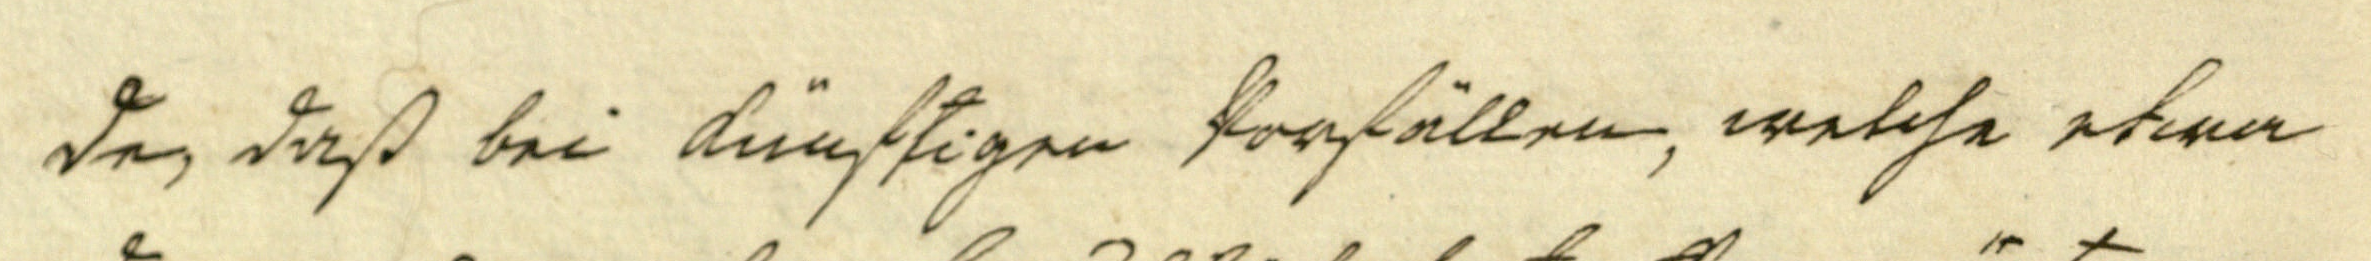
de, daß bei künftigen Vorfällen, welche etwa
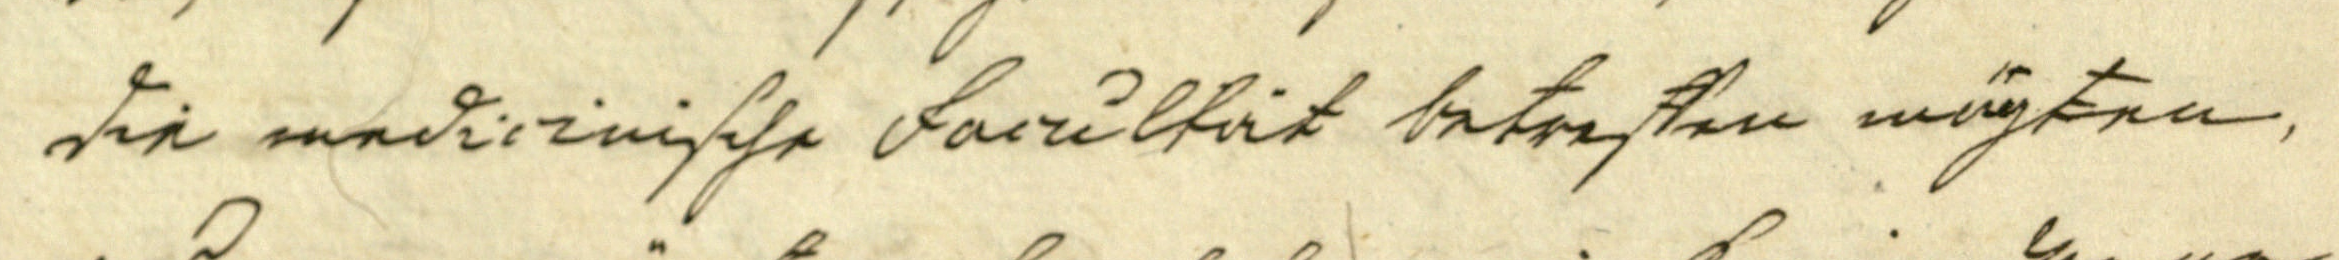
die medicinische Facultät betreffen mögten,
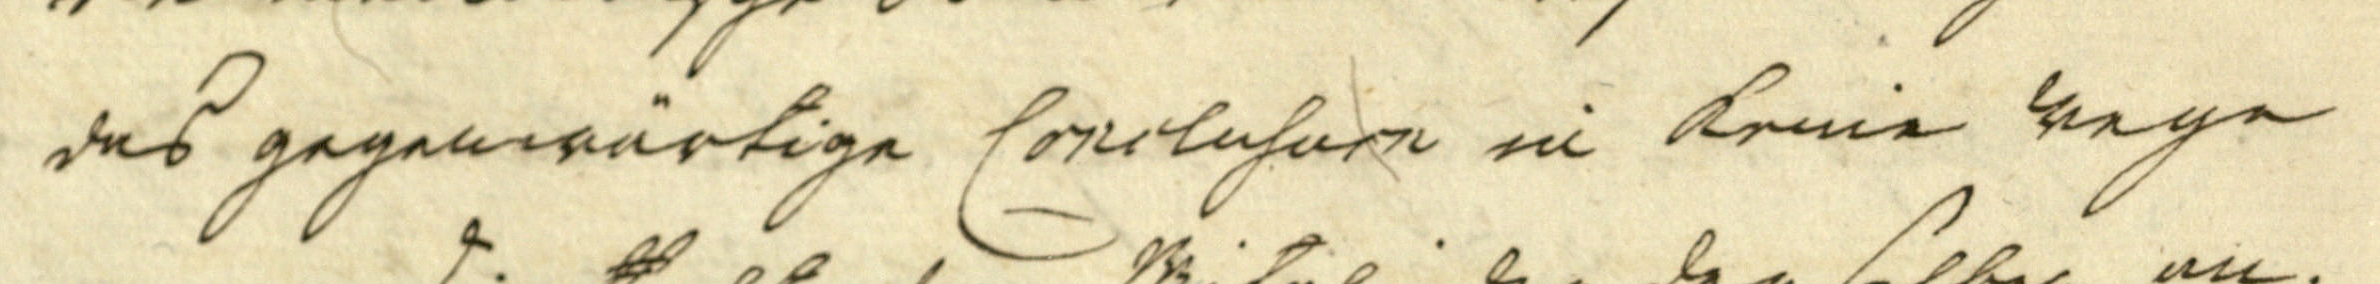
das gegenwärtigen Conclusum in keine Wege
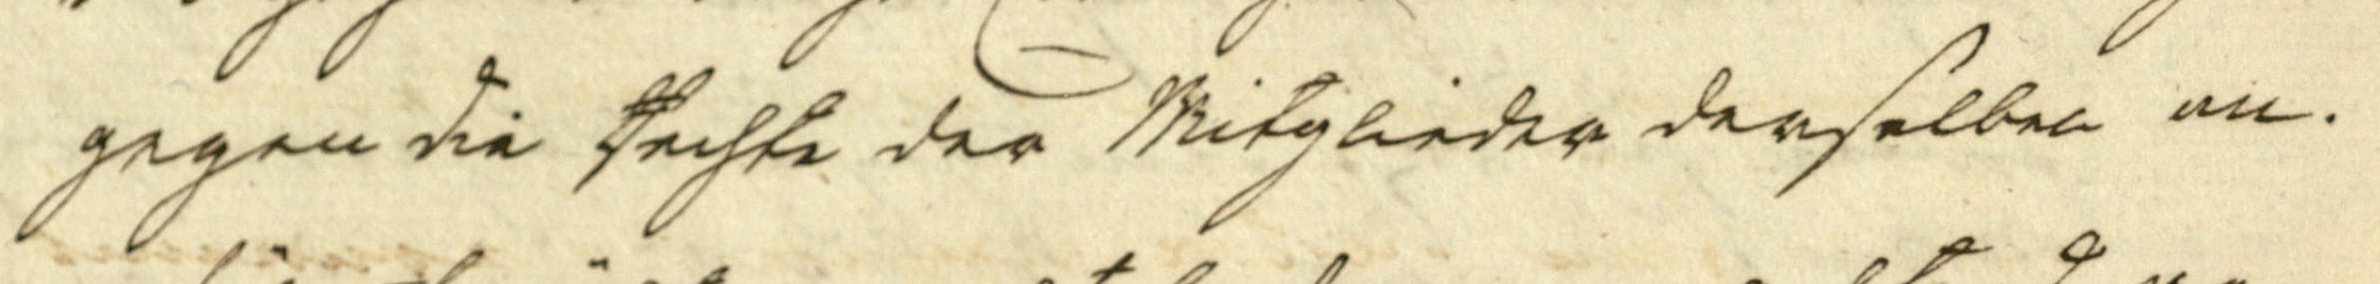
gegen die Rechte der Mitglieder derselben an¬
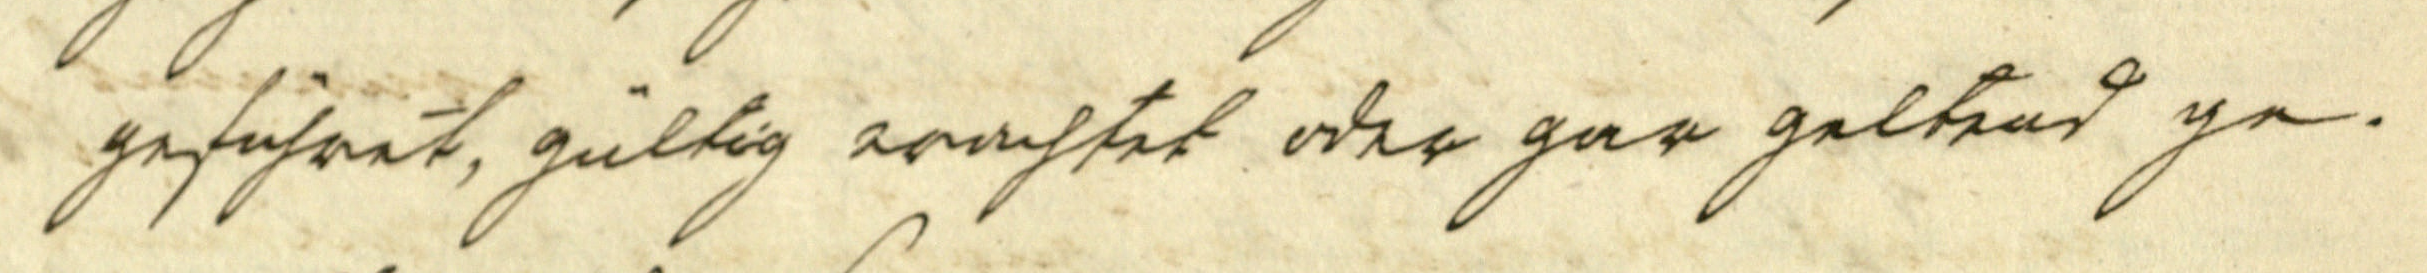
geführet, gültig erachtet oder gar geltend ge¬
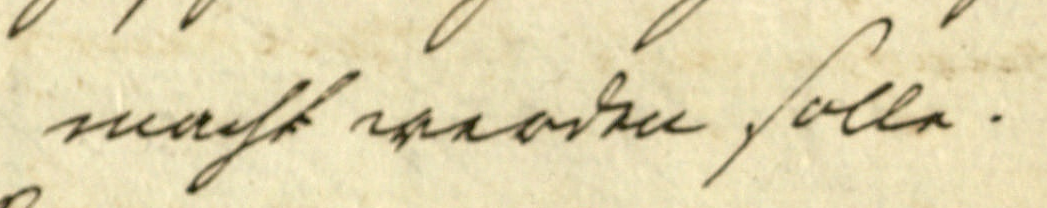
macht werden solle.
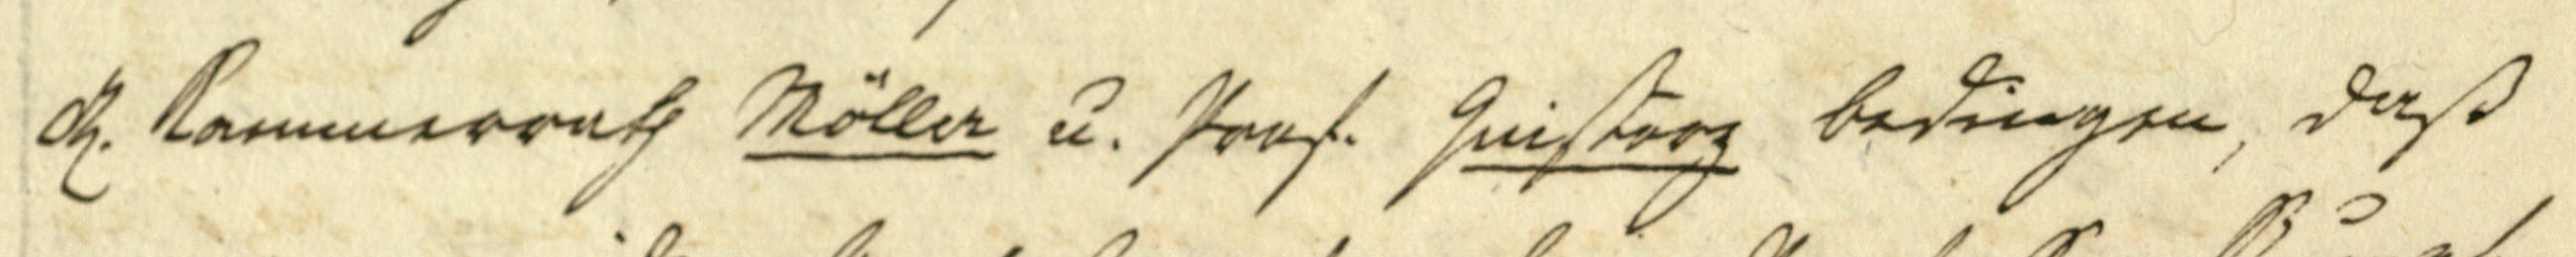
dh. Kammerrath Möller u. Prof. Quistorp bedingen, daß
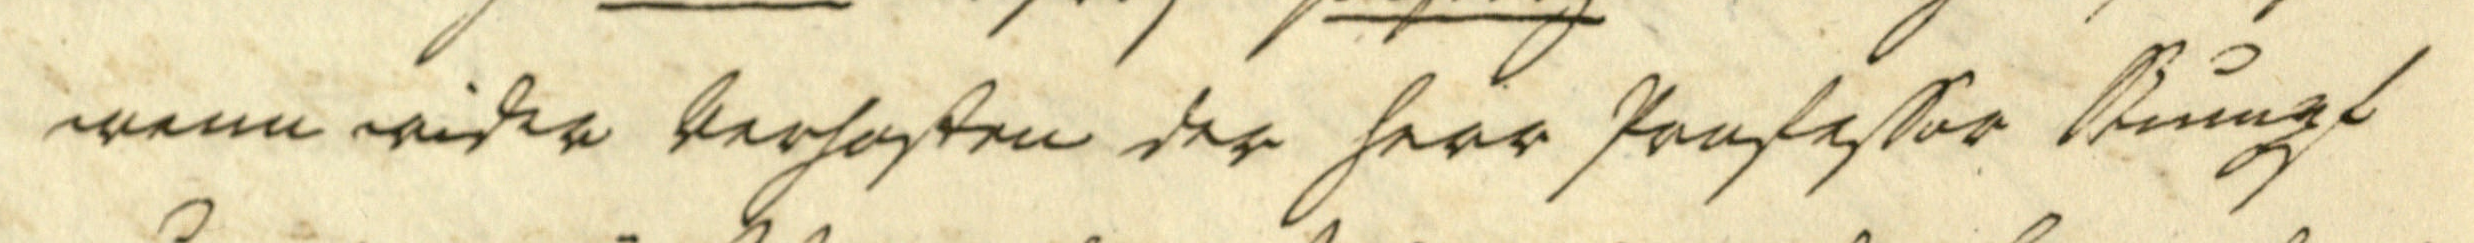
wenn wider Verhofen der Herr Professor Stumpf
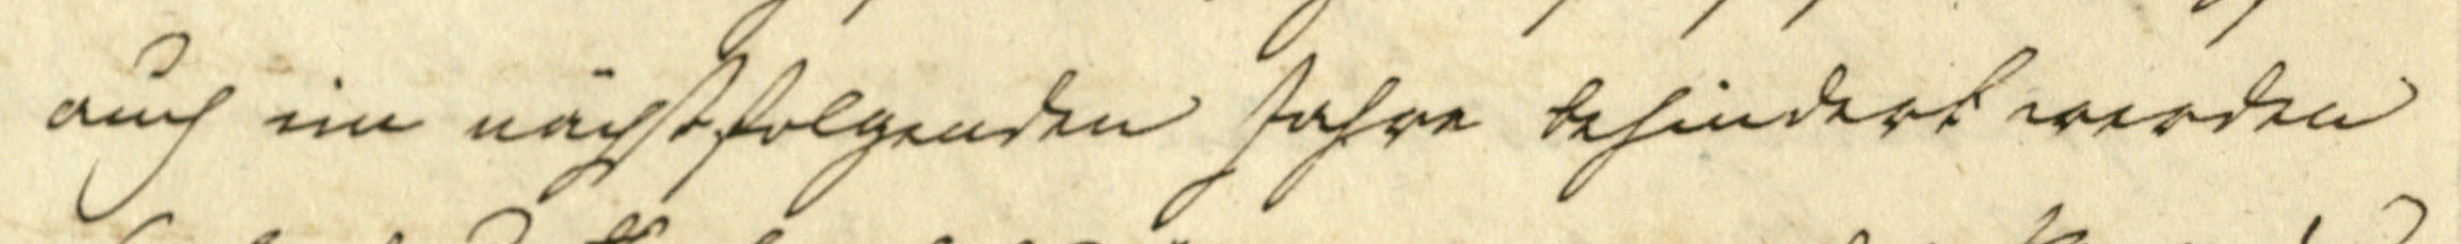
auch im nächstfolgenden Jahre behindert werden
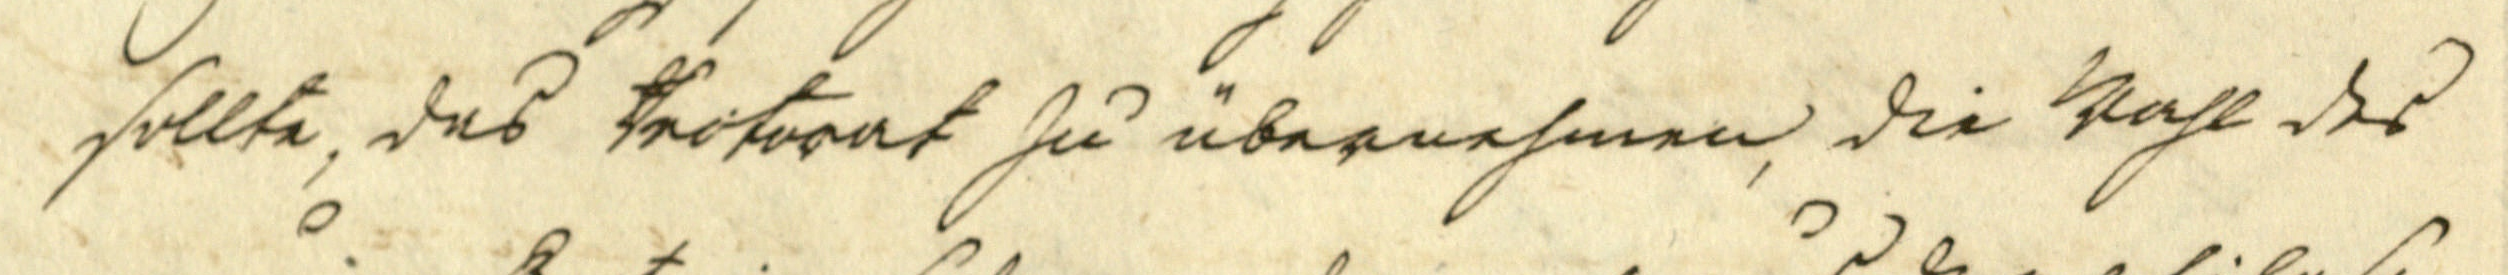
sollte, das Rectorat zu übernehmen, die Wahl des
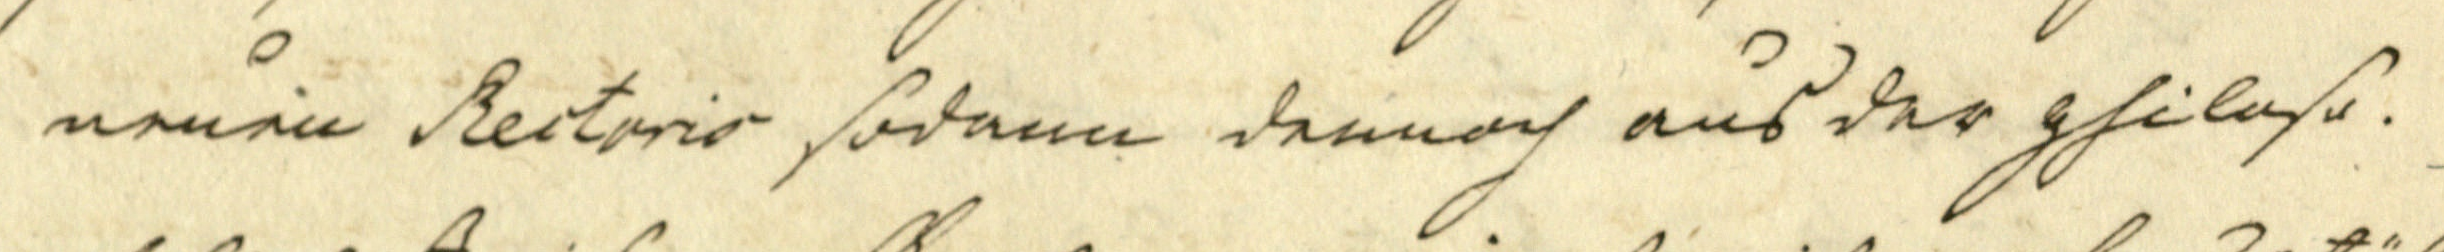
neuen Rectoris sodann dennoch aus der philoso¬
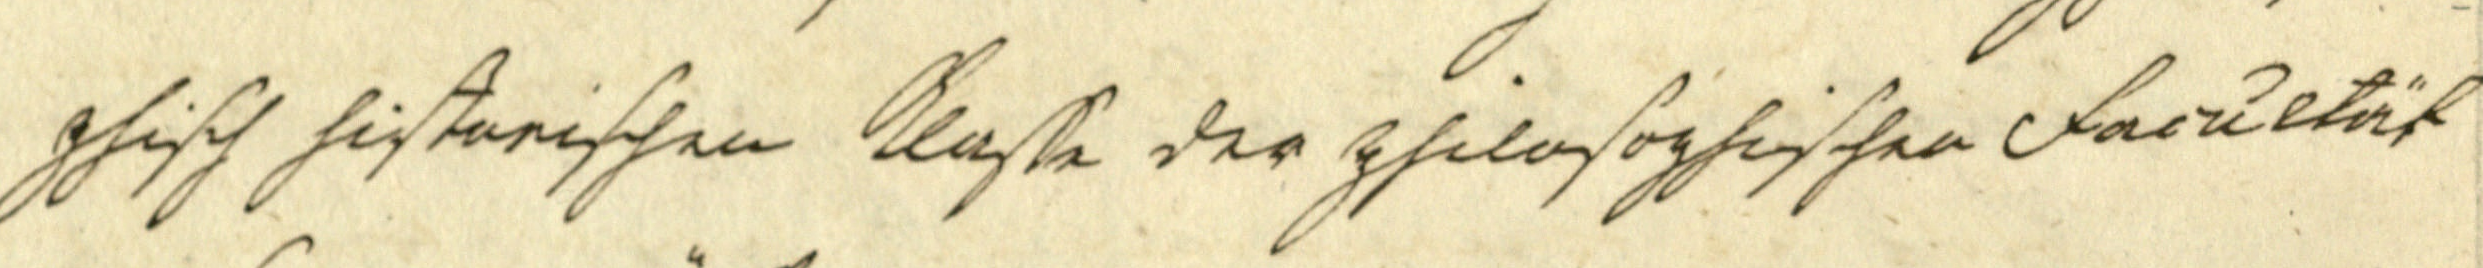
phisch historischen Klasse der philosophischen Facultät
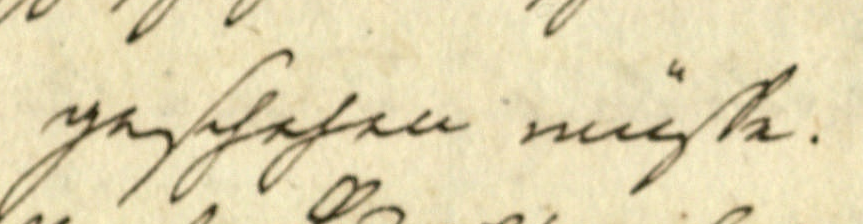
geschehen müsse.
